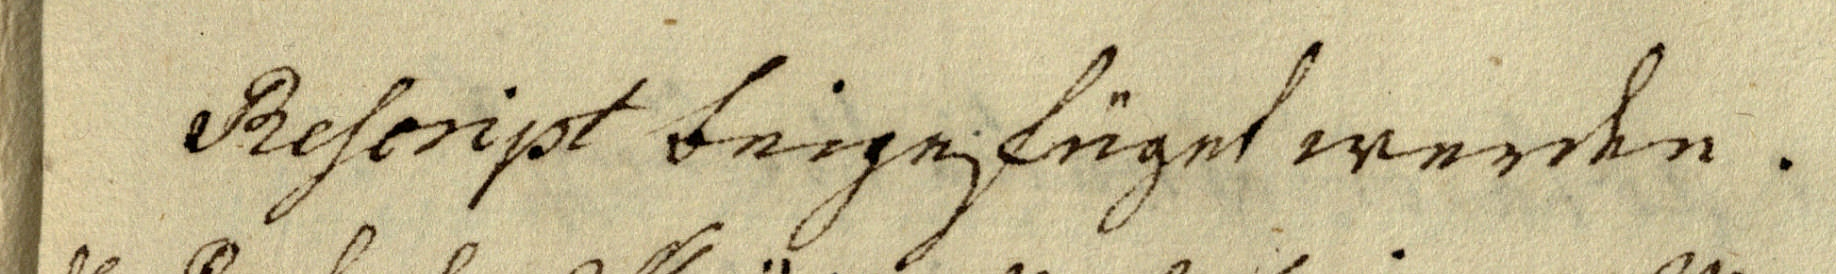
Rescript beigefüget werden.
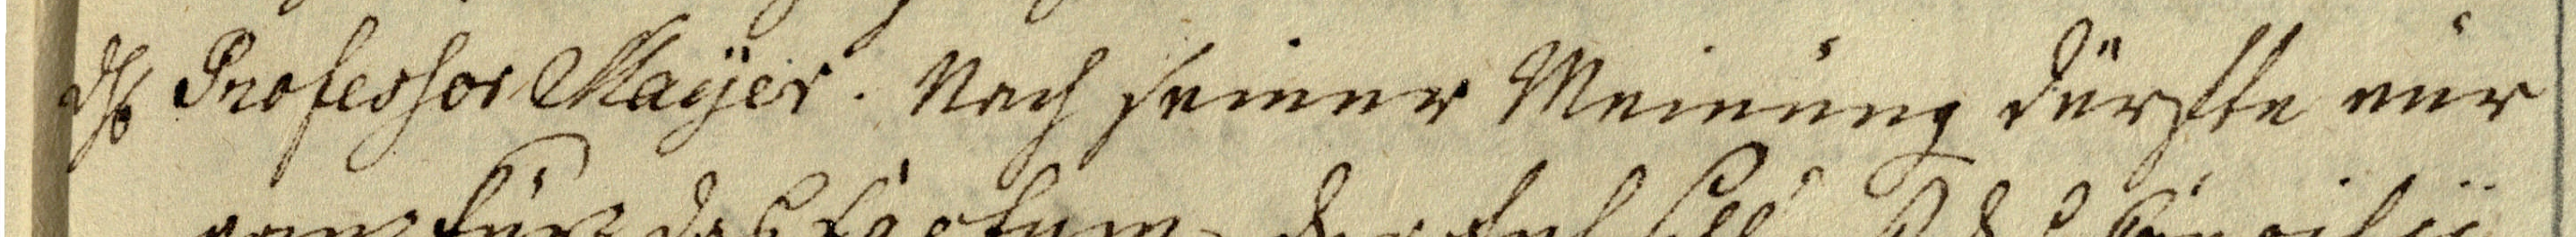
dh Professor Maÿer. Nach seiner Meinung dürfte nur
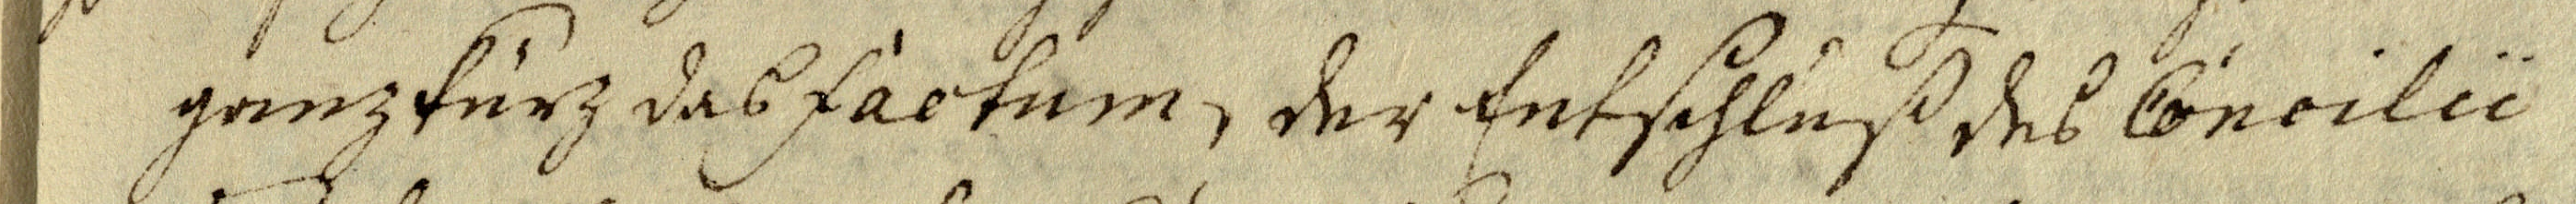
ganz kurz das Factum, der Entschluß des Concilii
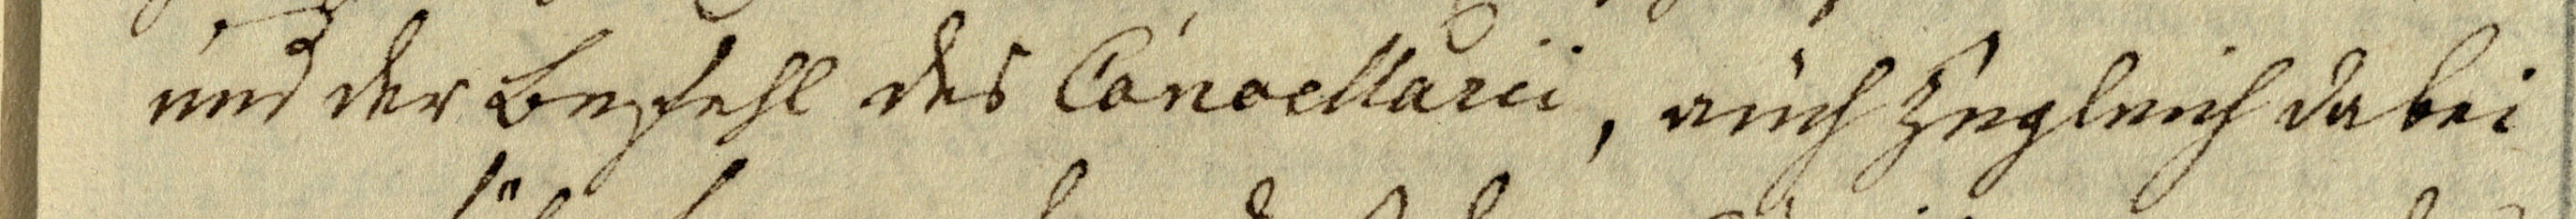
und der Befehl des Cancellarii, auch zugleich dabei
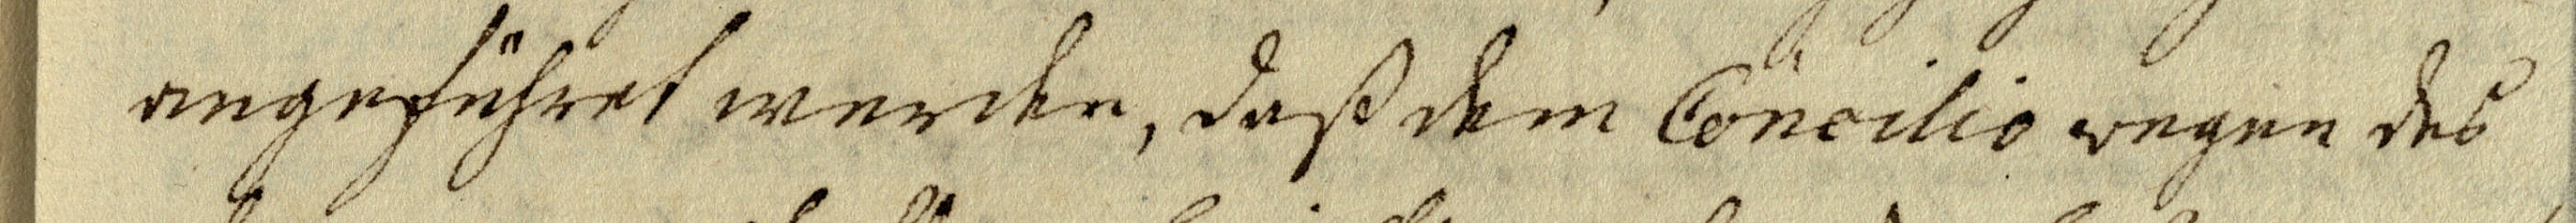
angeführet werden, daß dem Concilio wegen des
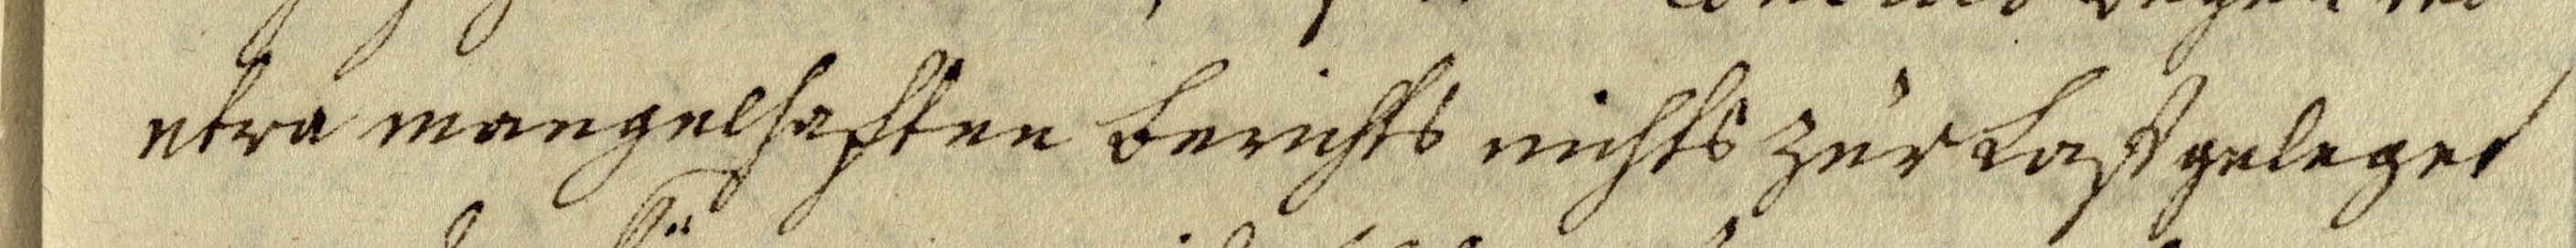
etwa mangelhaften Berichts nichts zur Last geleget
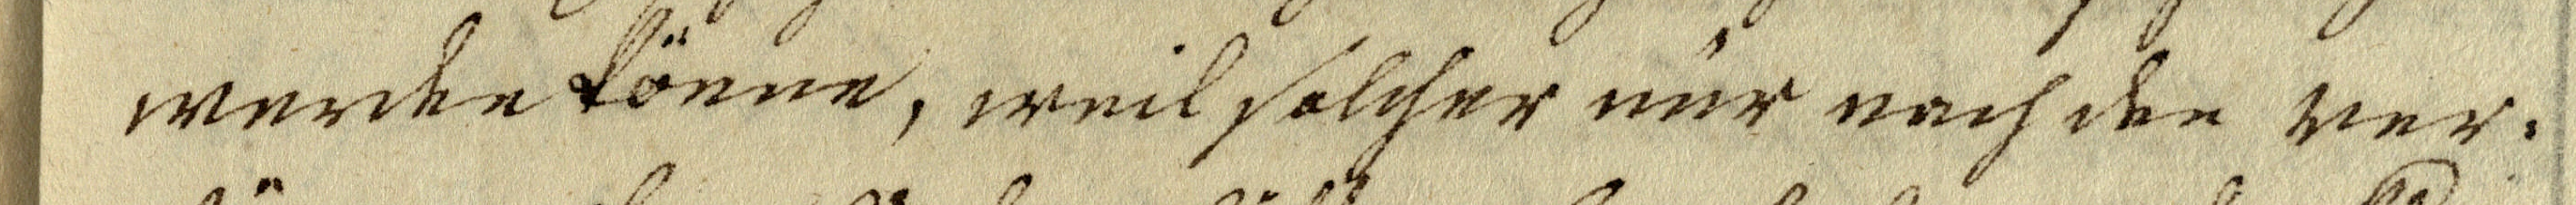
werden könne, weil solcher nur nach den ver¬
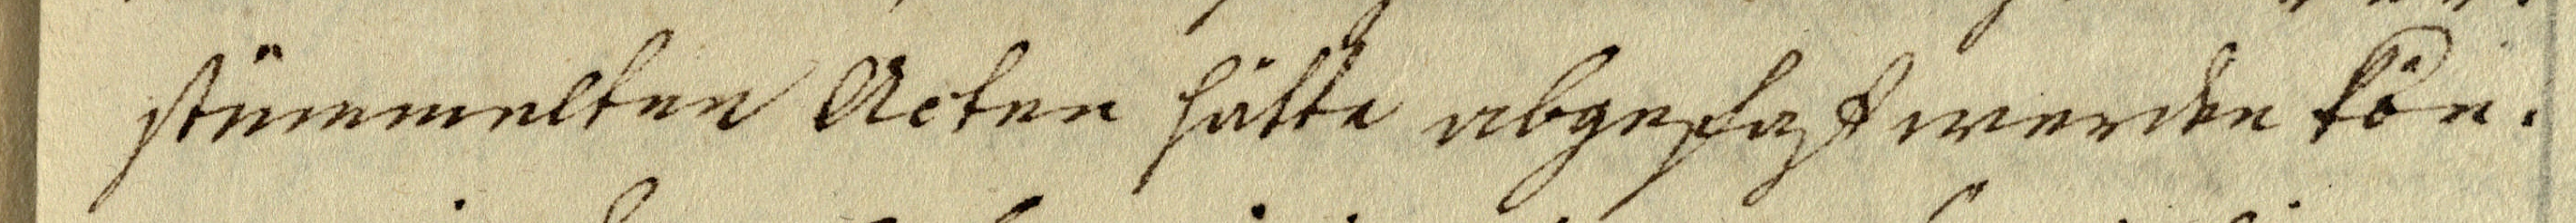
stümmelten Acten hätte abgefast werden kön¬
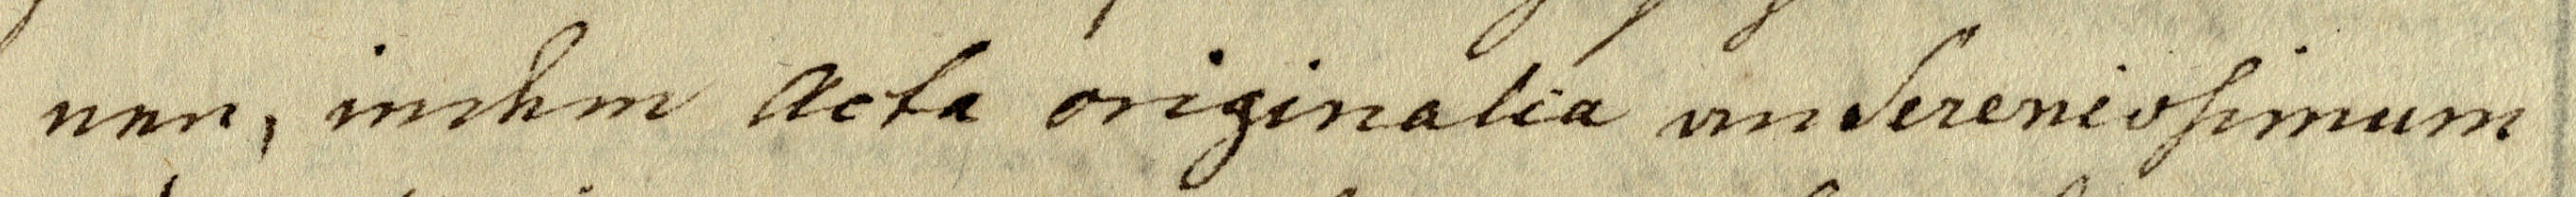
nen, indem Acta originalia an Serenissimum
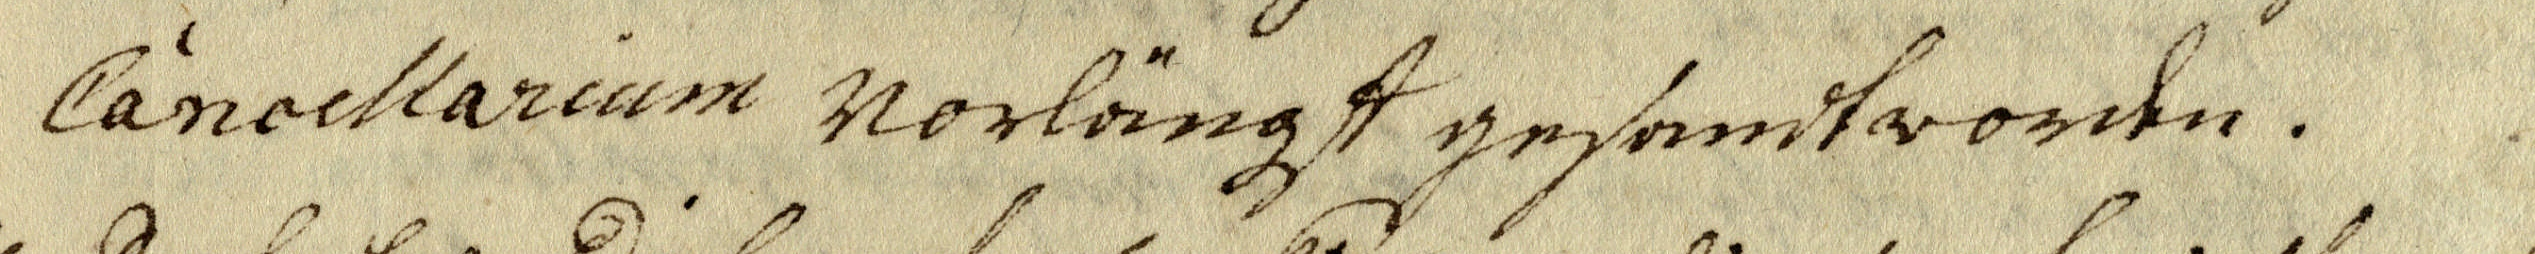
Cancellarium vorlängst gesandt worden.
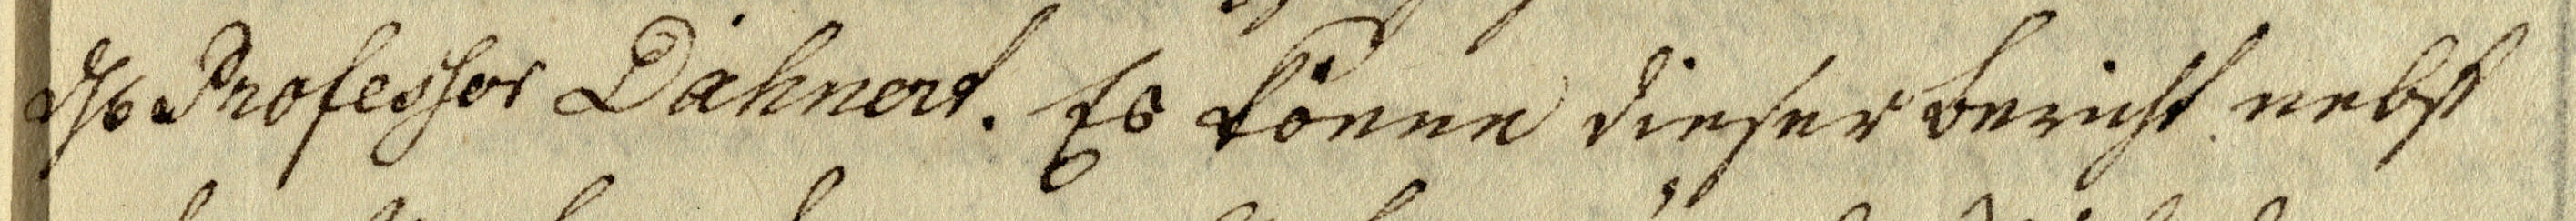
dh Professor Dähnert. Es könne dieser Bericht nebst
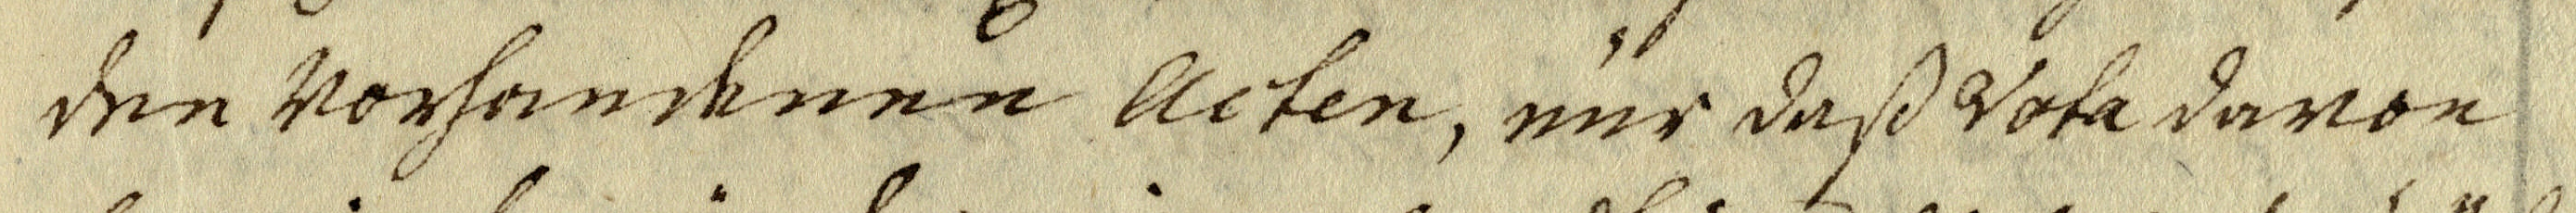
den vorhandenen Acten, nur daß Vota davon
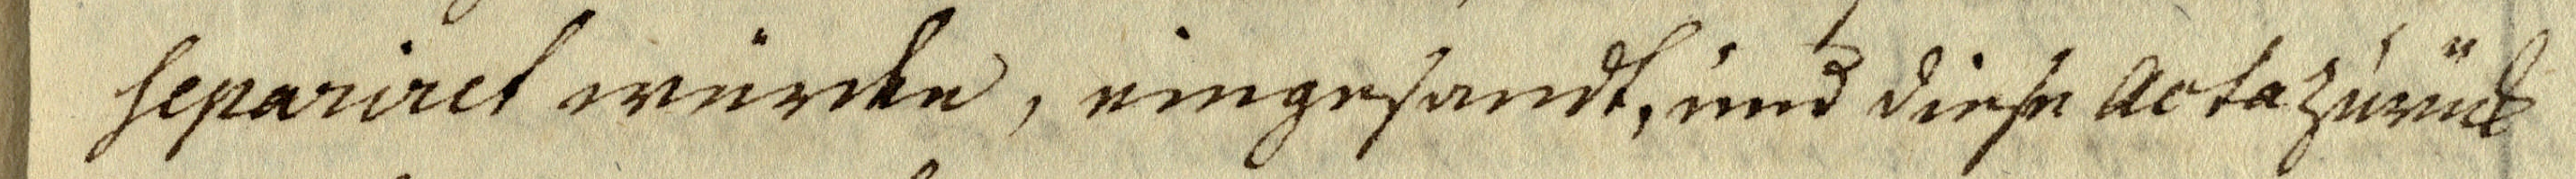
separiret würden, eingesandt, und idese Acta zurück
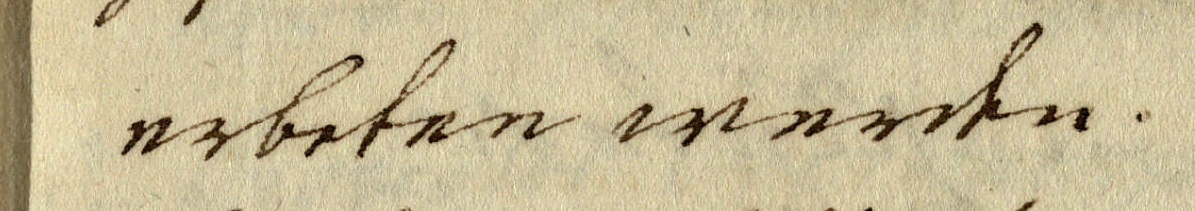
erbeten werden.
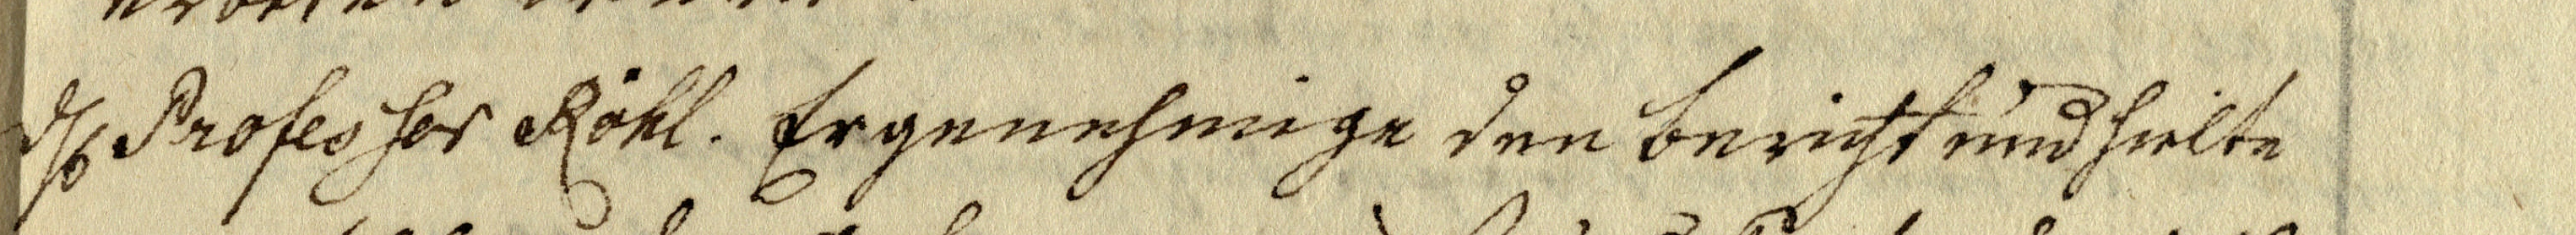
dh Professor Röhl. Er genehmige den Bericht und hielte
